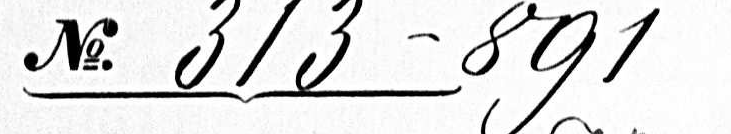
No. 313 – 1891
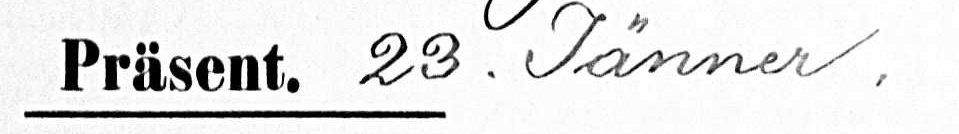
Präsent. 23 Jänner
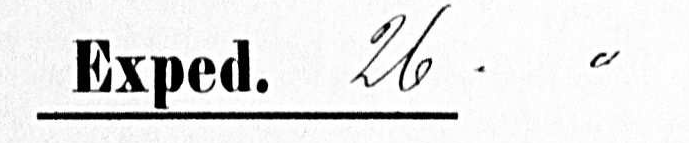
Expedit 26. Jänner
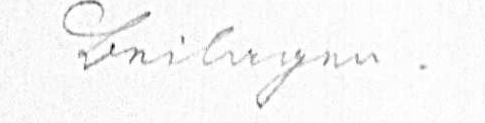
Beilagen
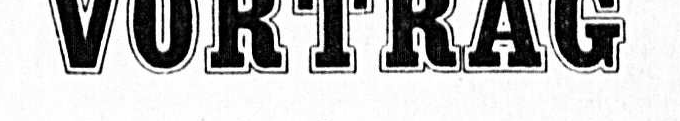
VORTRAG
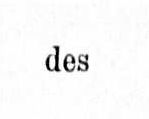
Des
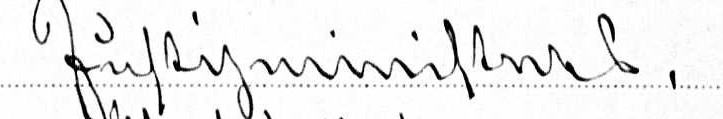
Justizministers
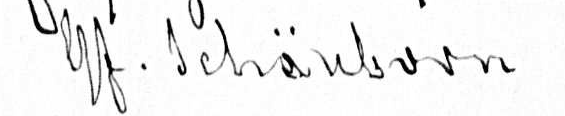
Gf. Schönborn
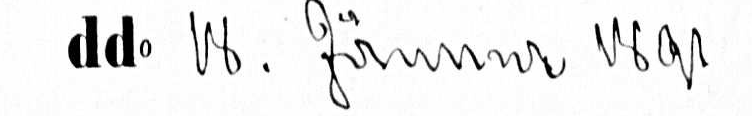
Ddo 18 Jänner 1891
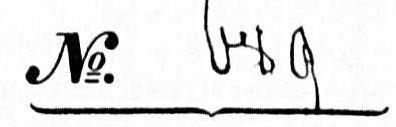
No 689
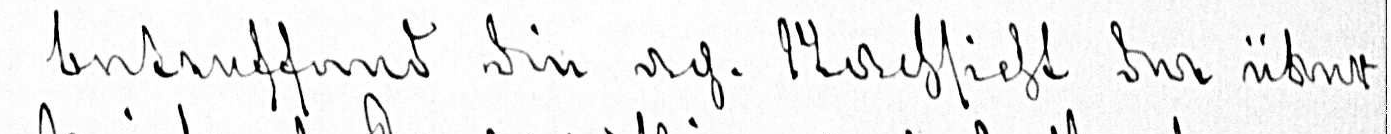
Betreffend die a.g. Nachsicht der über
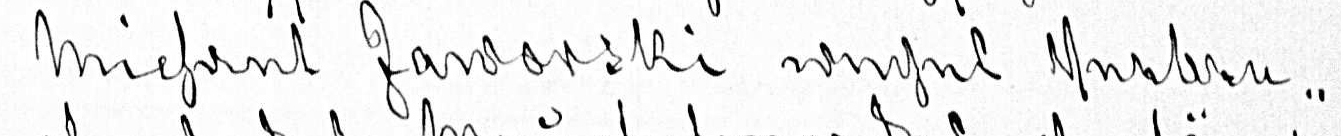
Michael Jaworski wegen Verbre¬
